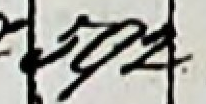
592
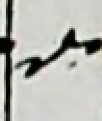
do
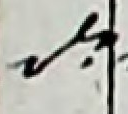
do
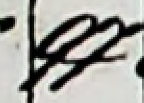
97
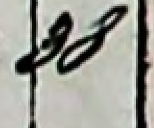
38
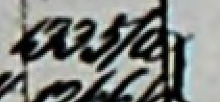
1335/a
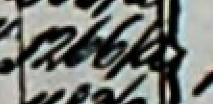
1266/a
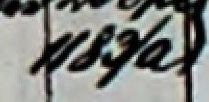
1183/a
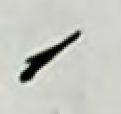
1
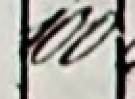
100
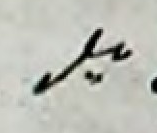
do
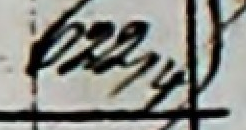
622,4
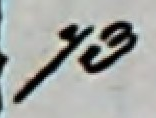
73
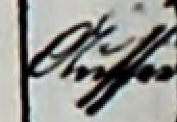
Aus„
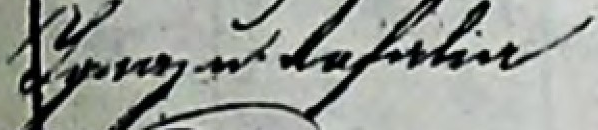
Ignaz u. Rosalia
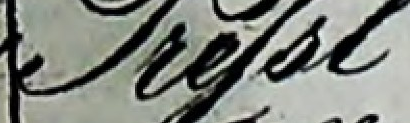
Tressl
